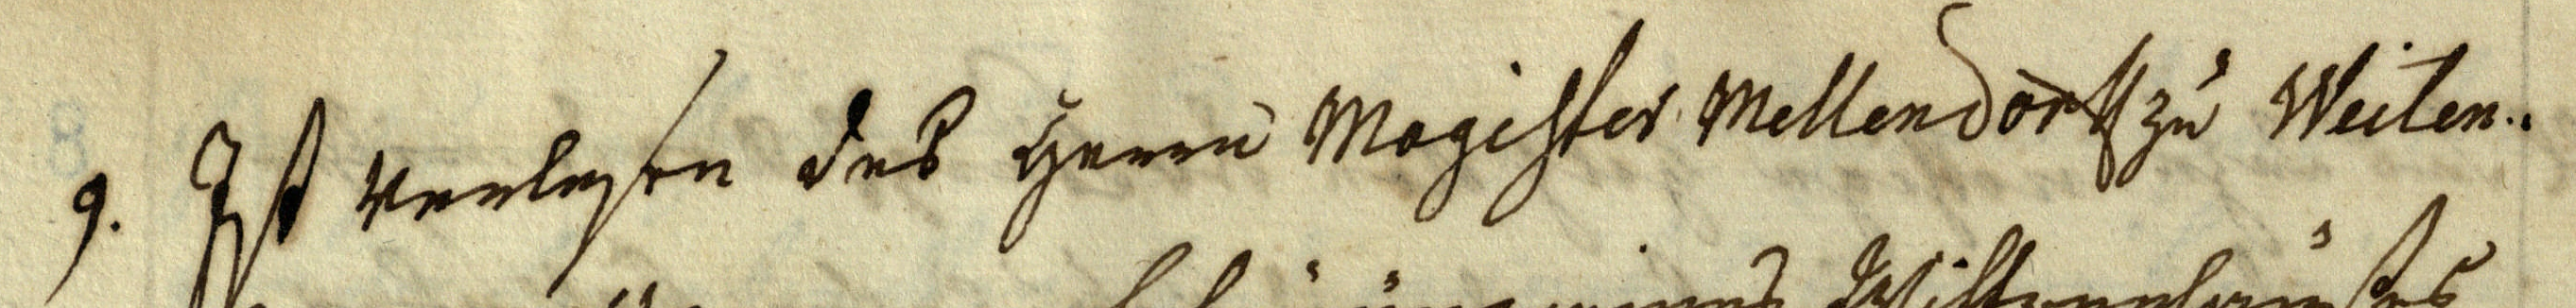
9. Ist verlesen des Herrn Magister Mellendorff zu Weiten¬
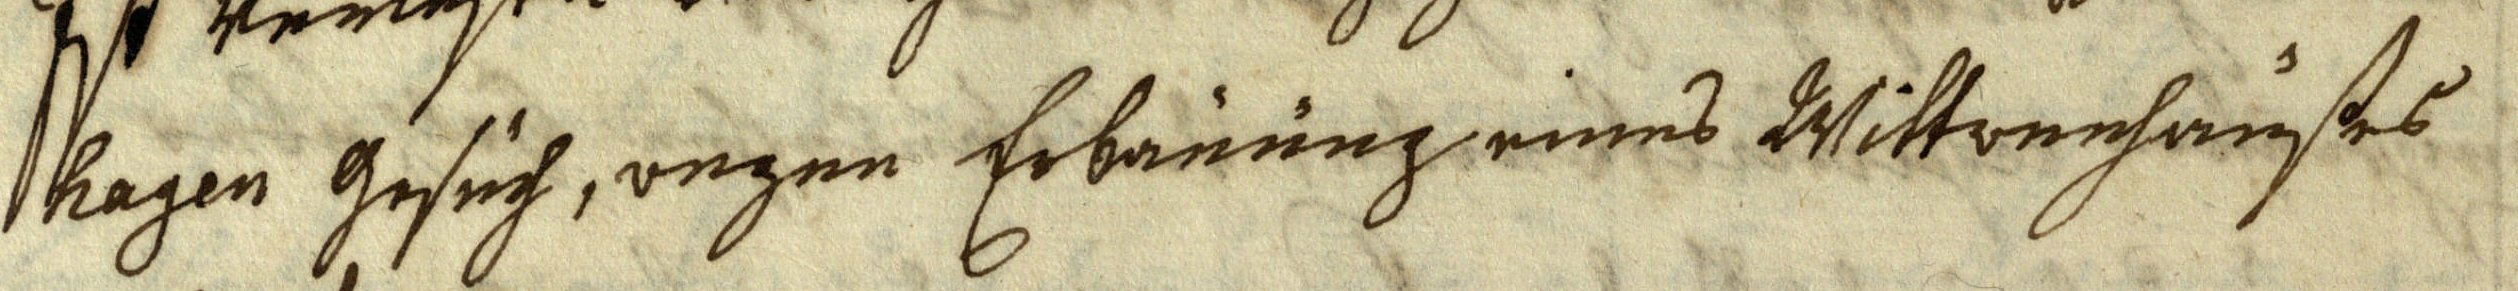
hagen Gesuch, wegen Erbauung eines Wittwenhaußes
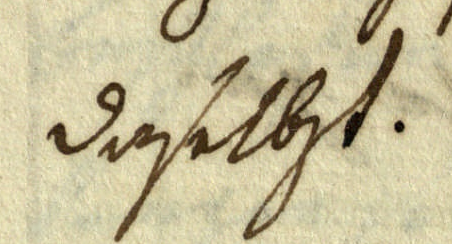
daselbst.
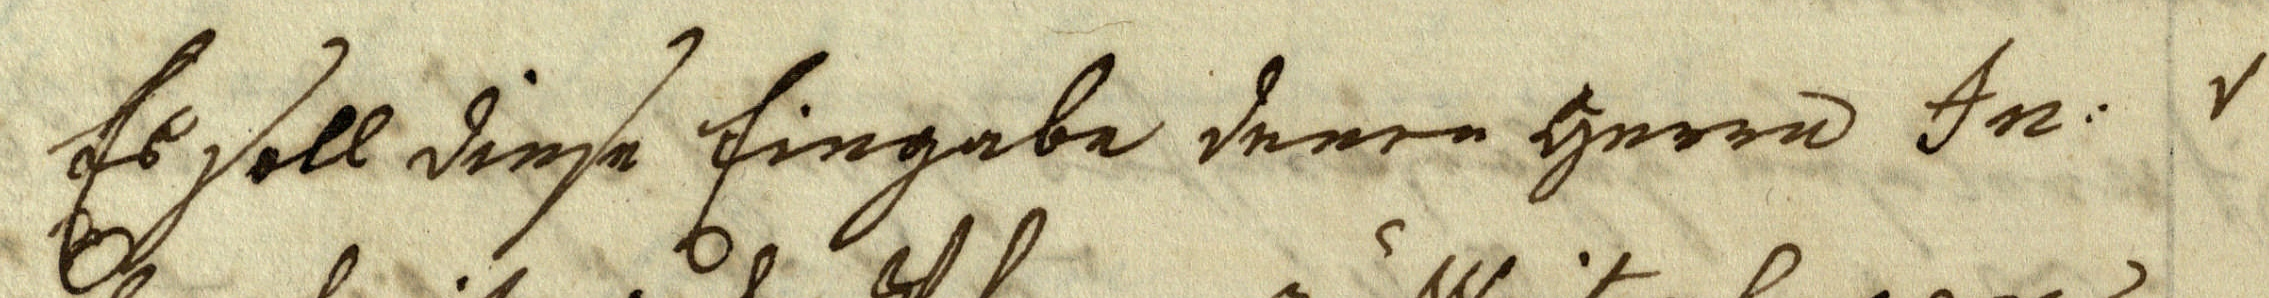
Es soll diese Eingabe denen Herrn In¬
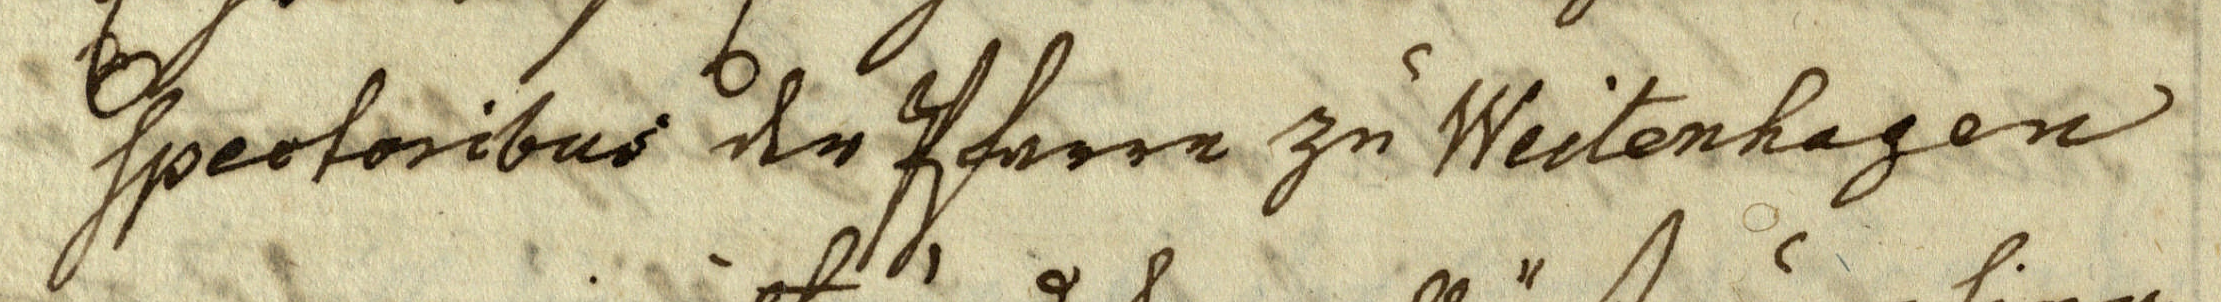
spectoribus der Pfarre zu Weitenhagen
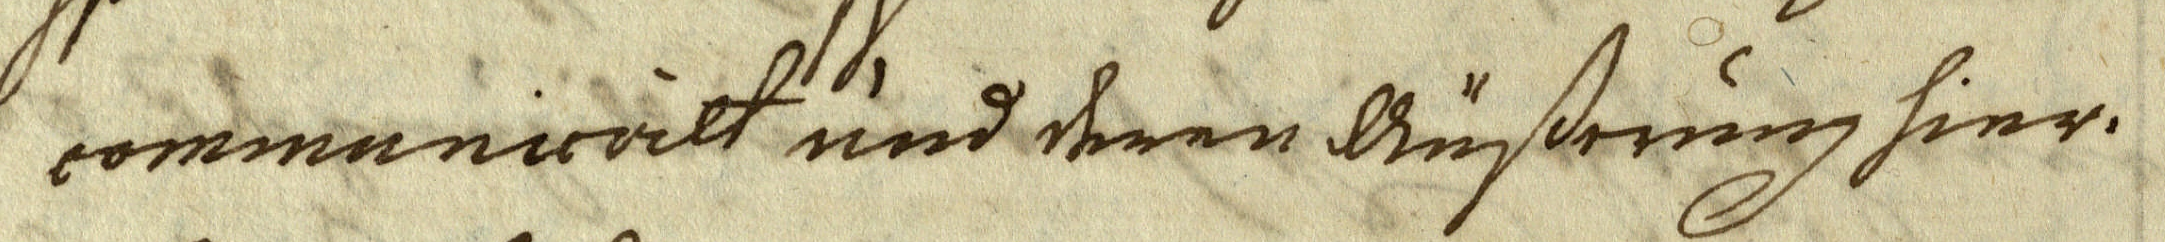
communiciret und deren Äußerung hier¬
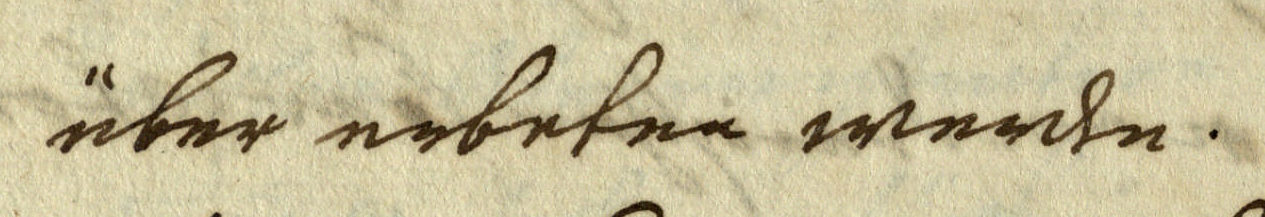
über erbeten werden.
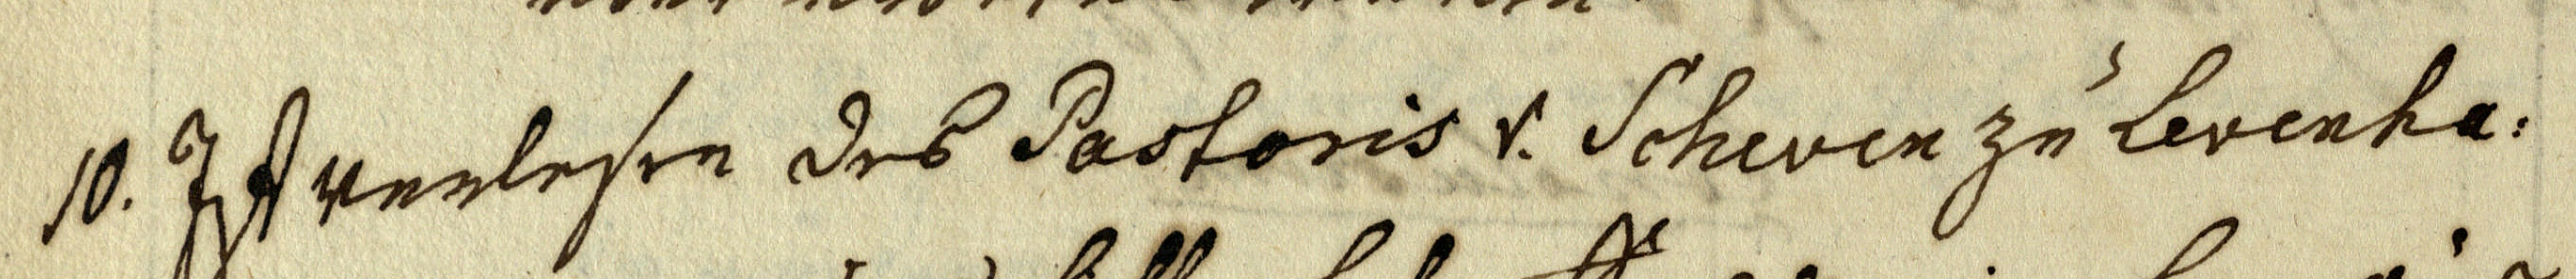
10. Ist verlesen des Pastoris v. Scheven zu Levenha¬
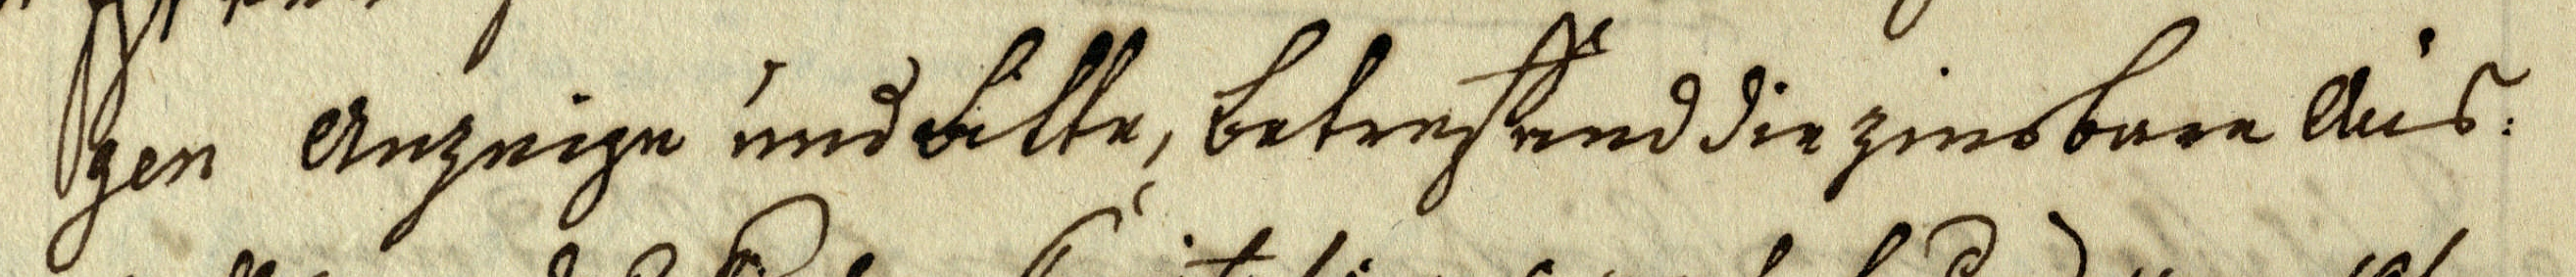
gen Anzeige und Bitte, betreffend die zinsbare Aus¬
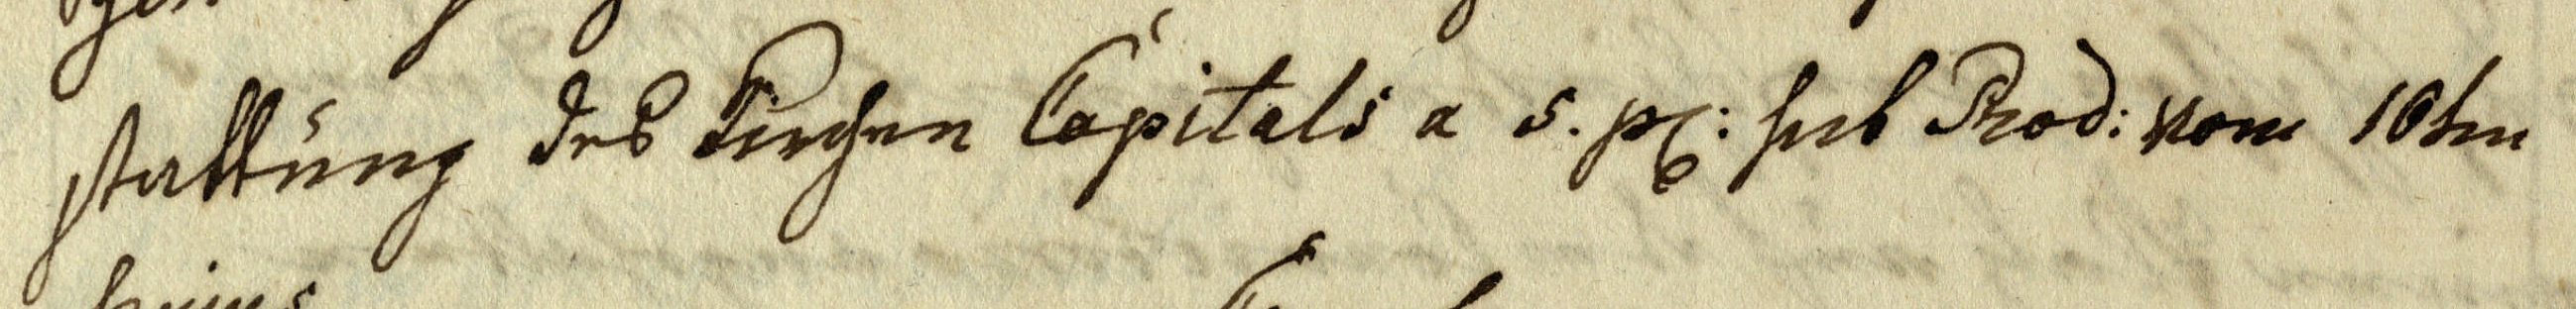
stattung des Kirchen Capitals a 5p. sub Prod. vom 10ten
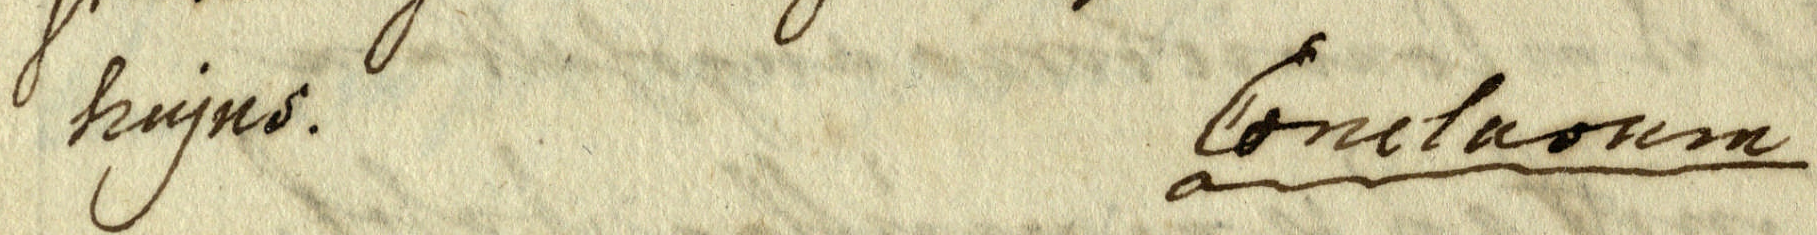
hujus. Conclusum
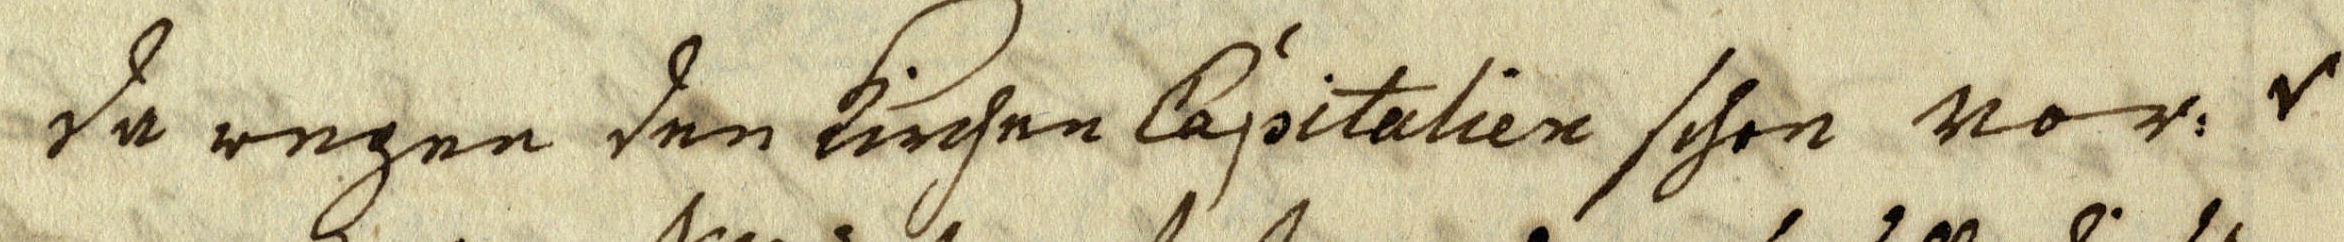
Da wegen den Kirchen Capitalien schon vor¬
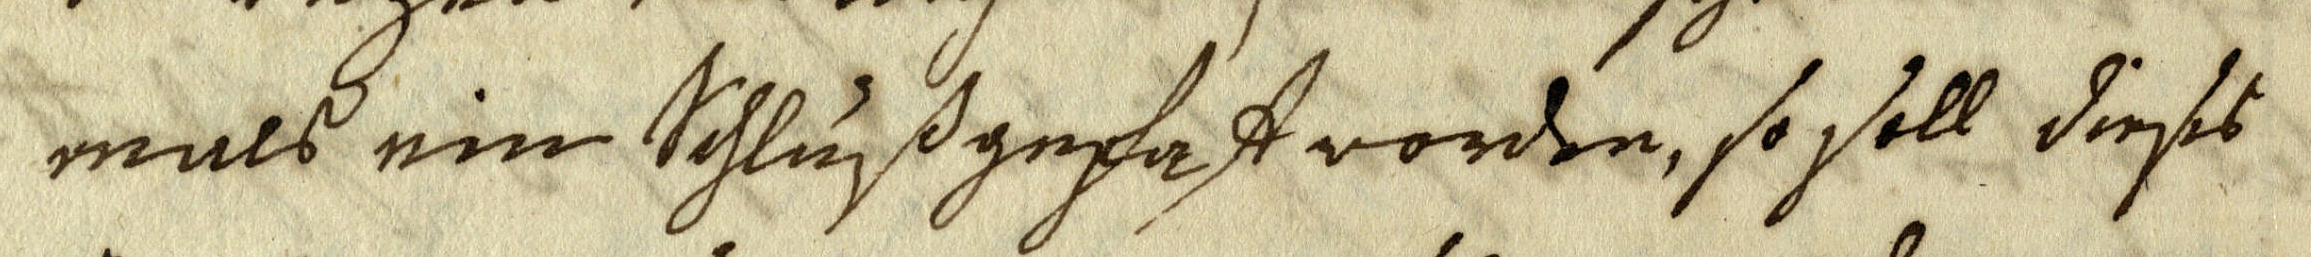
mals ein Schluß gefast worden, so soll dieses
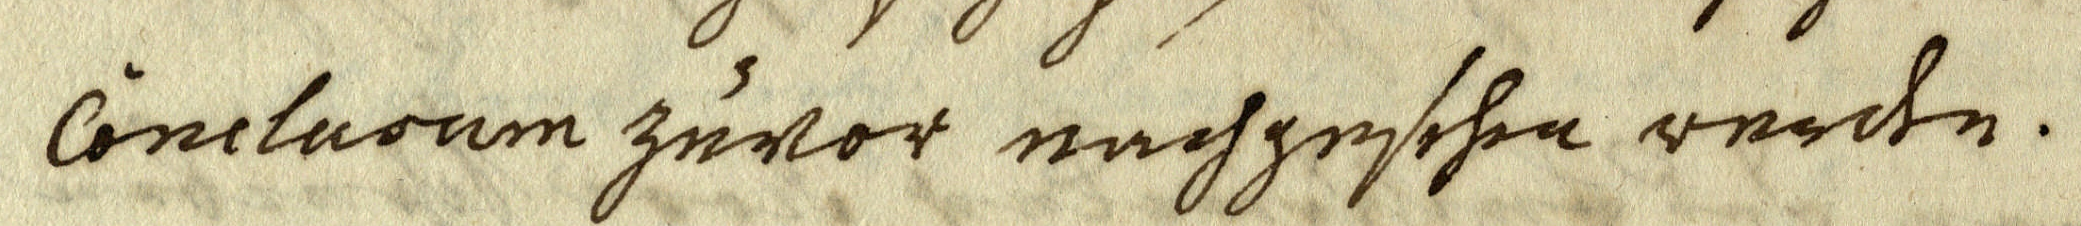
Conclusum zuvor nachgesehen werden.
